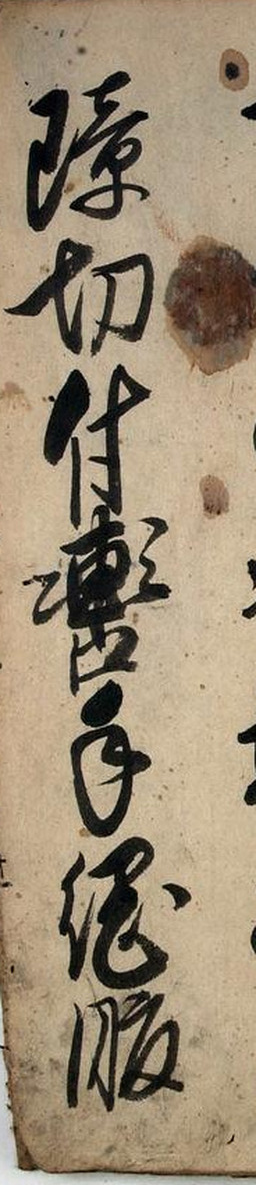障切付轡手綱腹

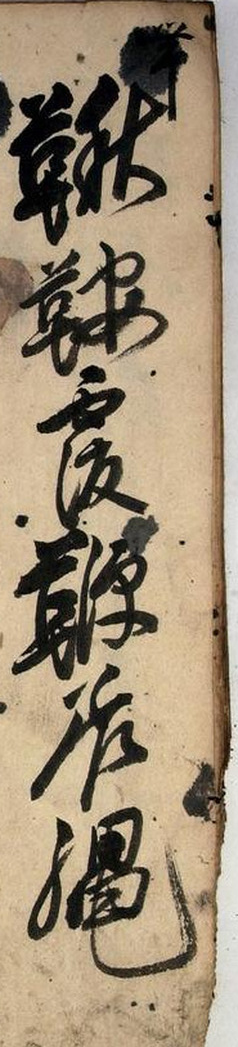鞦鞍覆鞭差縄
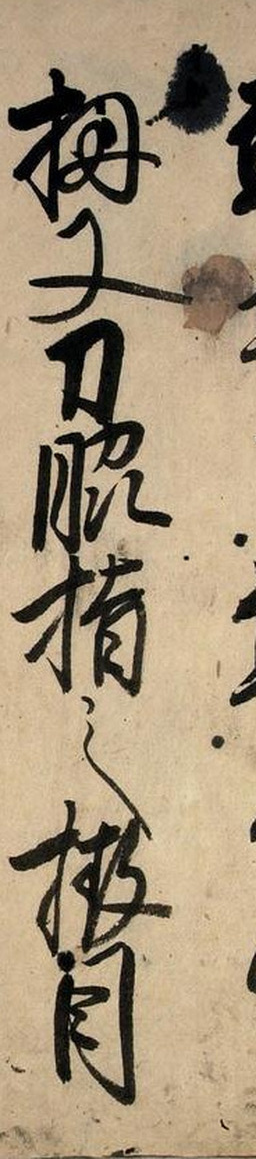扨亦刀脇指之拵目
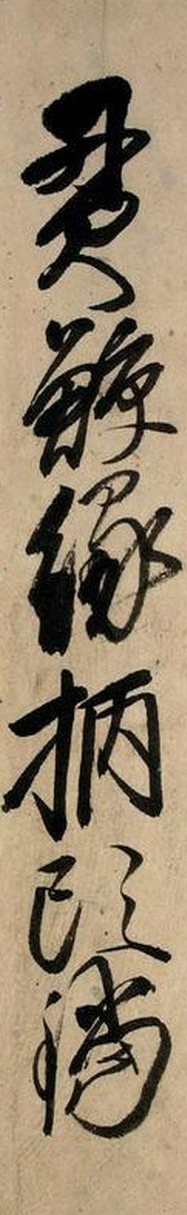貫鮫縁柄頭鐺
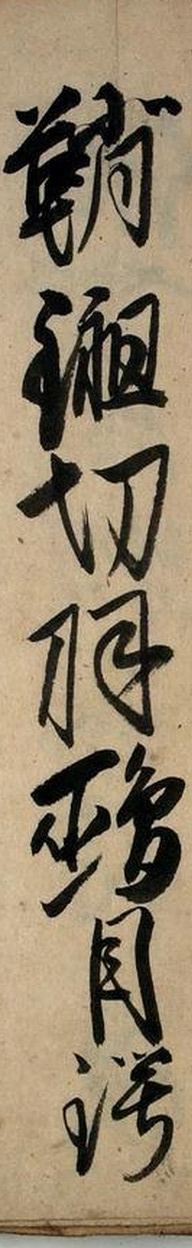鞘鎺切羽鵐目鍔
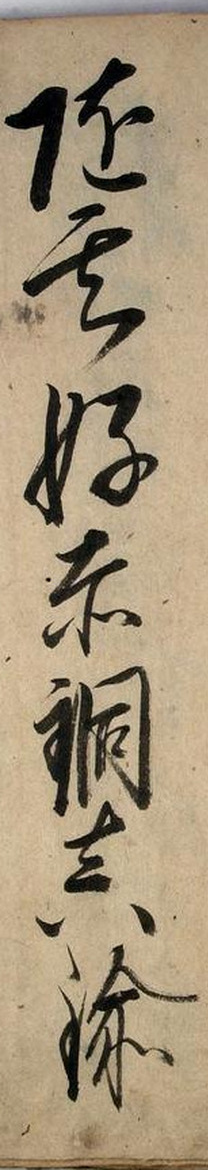随其好赤銅真鍮
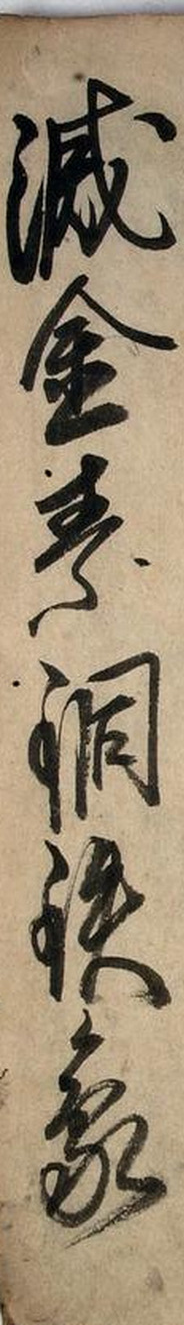滅金素銅鉄象

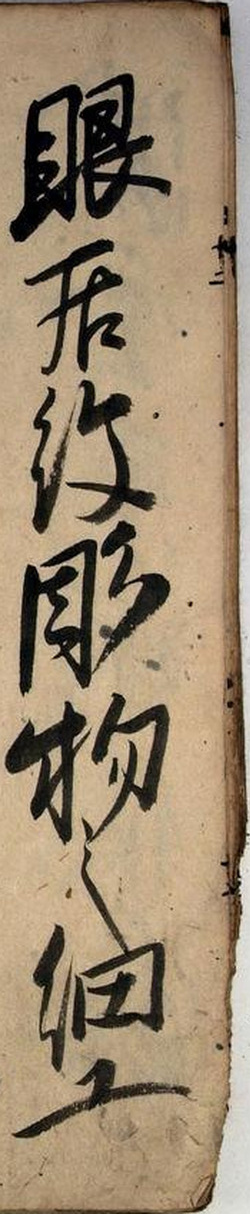眼居紋彫物之細工
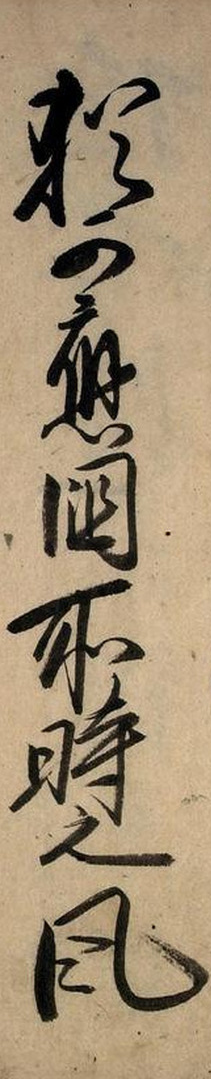猶可応国所時之風
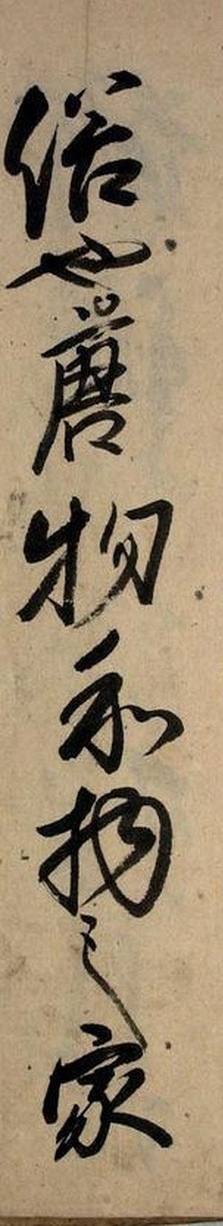俗也。唐物和物之家
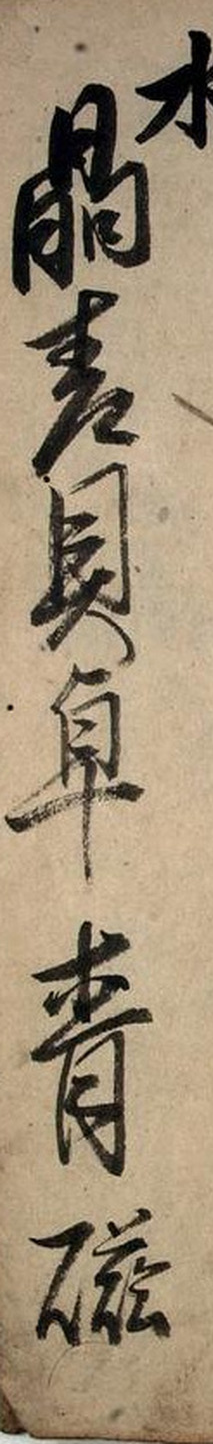水晶青貝卓青磁

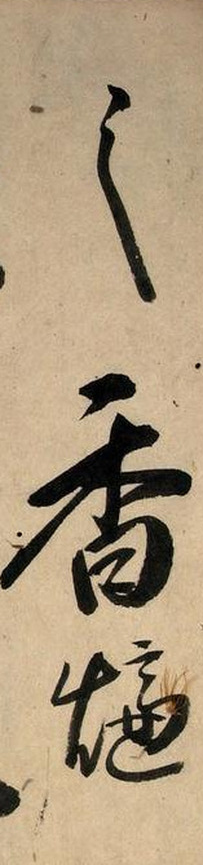之香炉
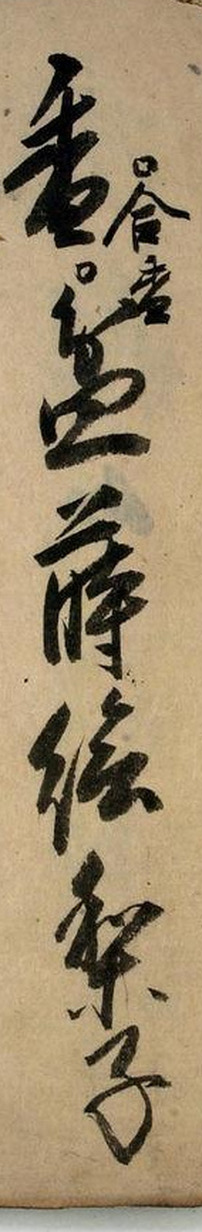香。盆蒔絵梨子
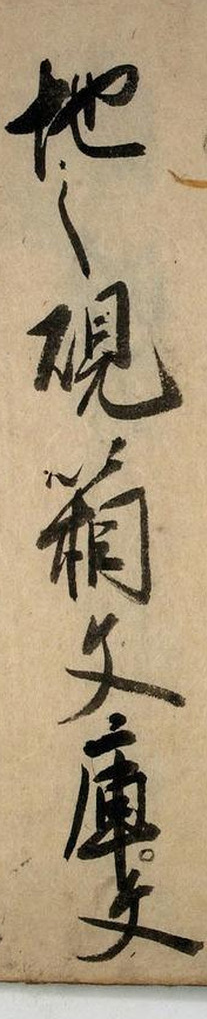地之硯箱文庫。文
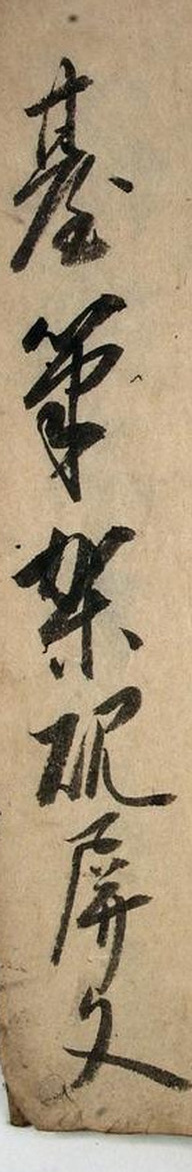台筆架硯屏文

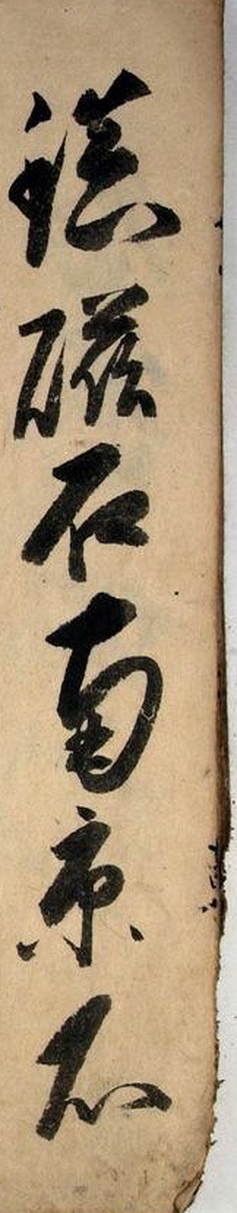鎮磁石南京石
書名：商売往来（往来物、手習、市之助・市兵衛の名もあり）
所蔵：福井県文書館 Fukui Prefectural Archives
